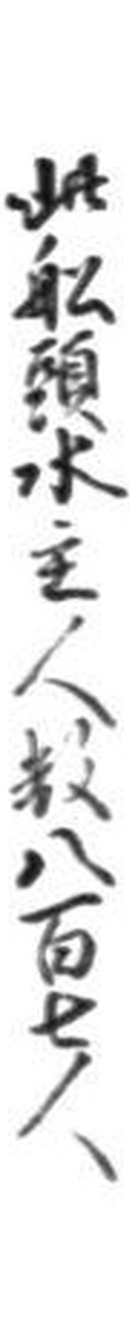此船頭水主人数八百七人
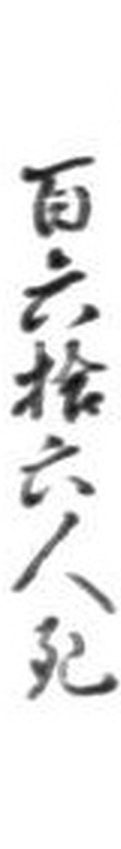内百六拾六人死
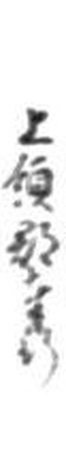上領郡奉行
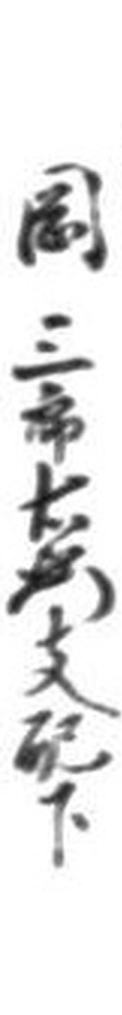岡三郎右衛門支配下
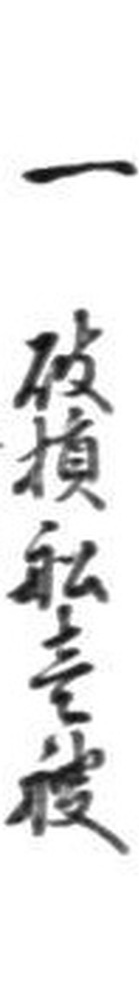一破損船壱艘
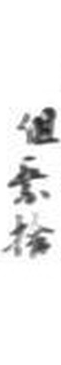但乗捨
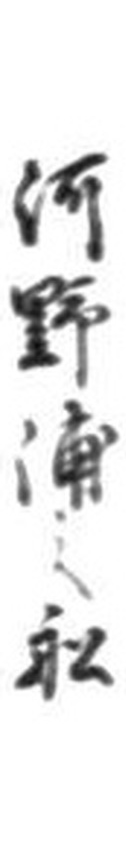河野浦之船
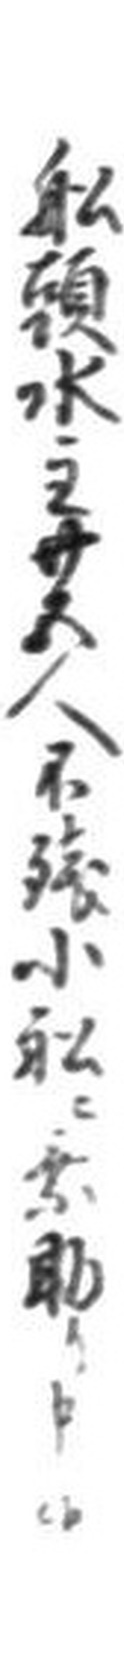船頭水主廿五人不残小船ニ乗助り申候

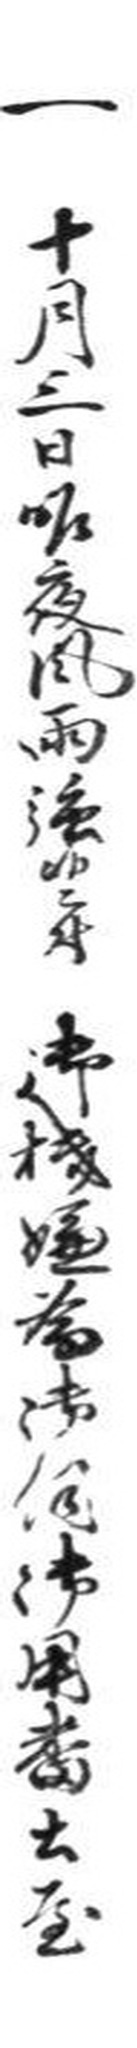一十月三日昨夜風雨強候ニ付御機嫌為御伺御用番土屋
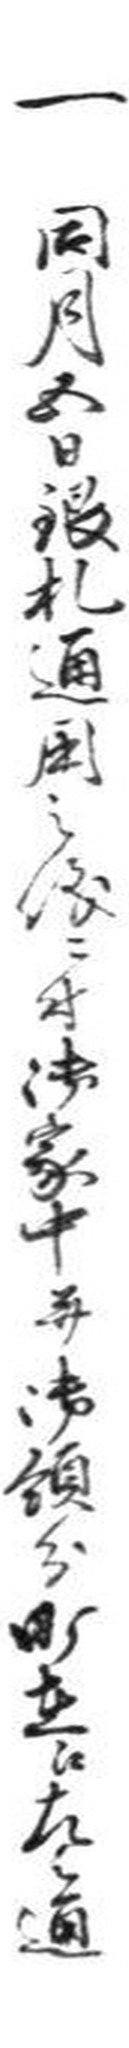一同月五日銀札通用之儀ニ付御家中并御領分町在江左之通
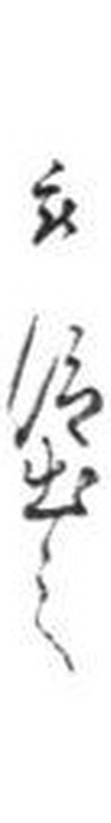被仰出之
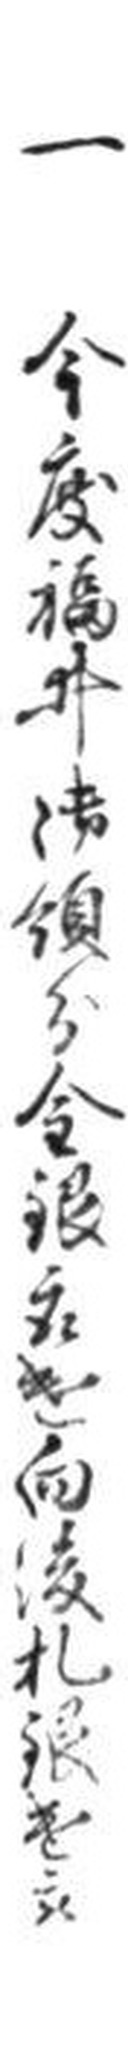一今度福井御領分金銀取遣向後札銀遣被
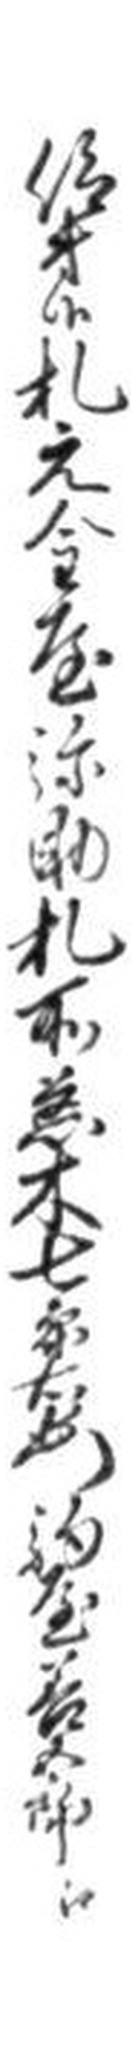仰付候札元金屋弥助札所荒木七郎右衛門駒屋善五郎江
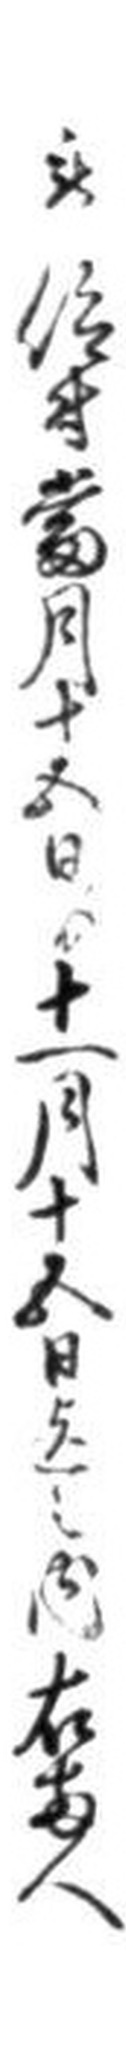被仰付当月十五日ゟ十一月十五日迄之内右両人
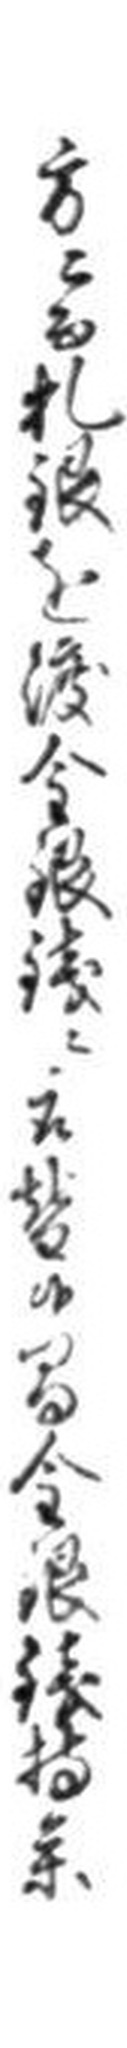方ニ而札銀を渡金銀銭ニ取替候間金銀銭持参
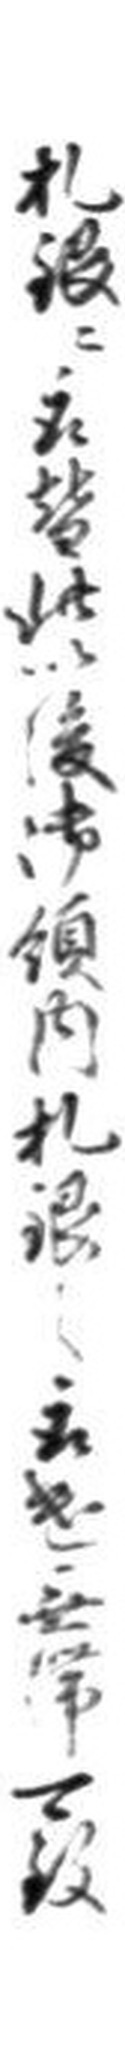札銀ニ取替此以後御領内札銀之取遣無滞可致
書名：家譜 二十二 吉品公 従元禄十五年到同十六年
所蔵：福井県文書館 Fukui Prefectural Archives
